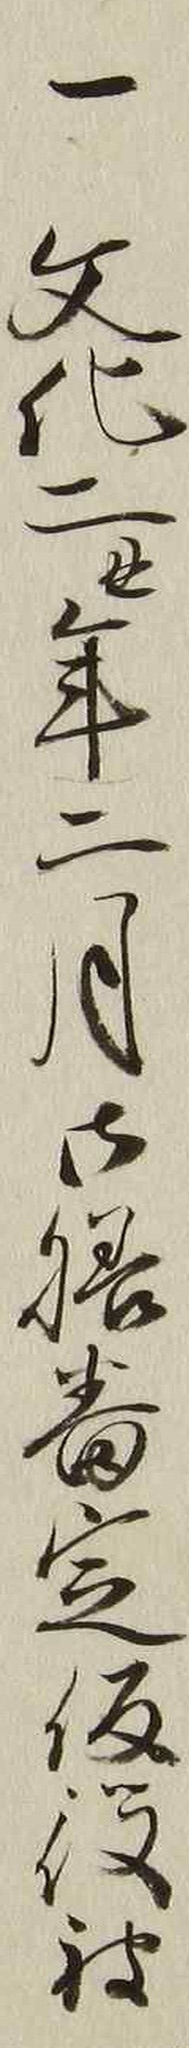一文化二丑年二月御膳番定仮役被
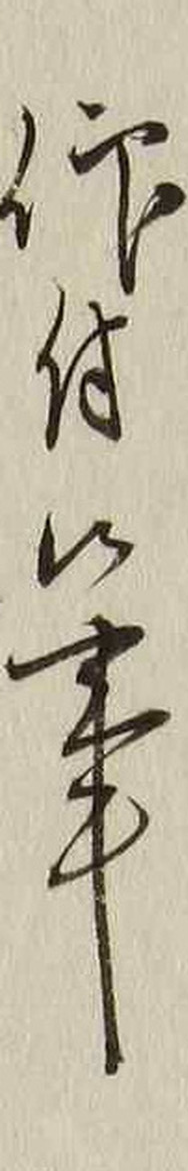仰付候事
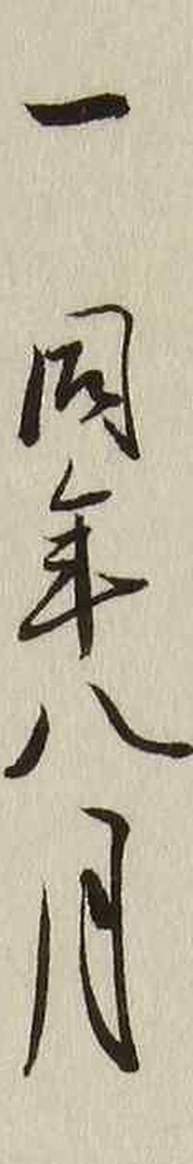一同年八月
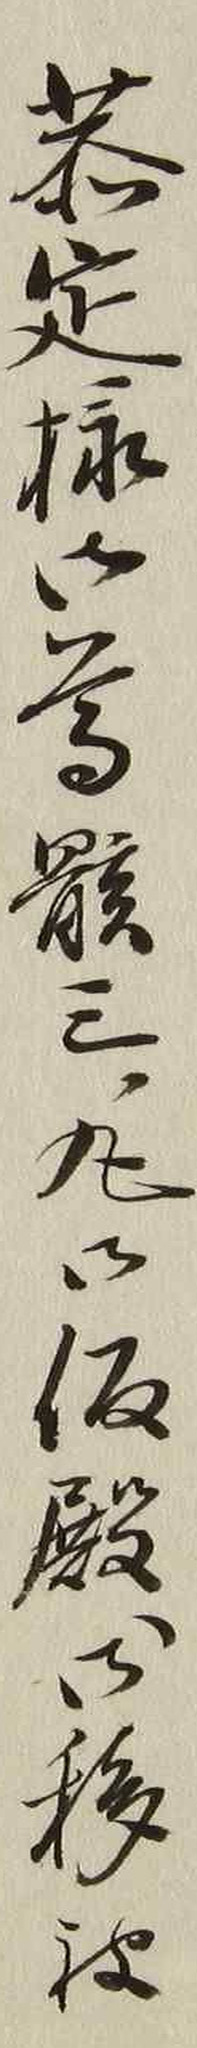恭定様御尊骸三ノ丸御仮殿ㇸ御移被
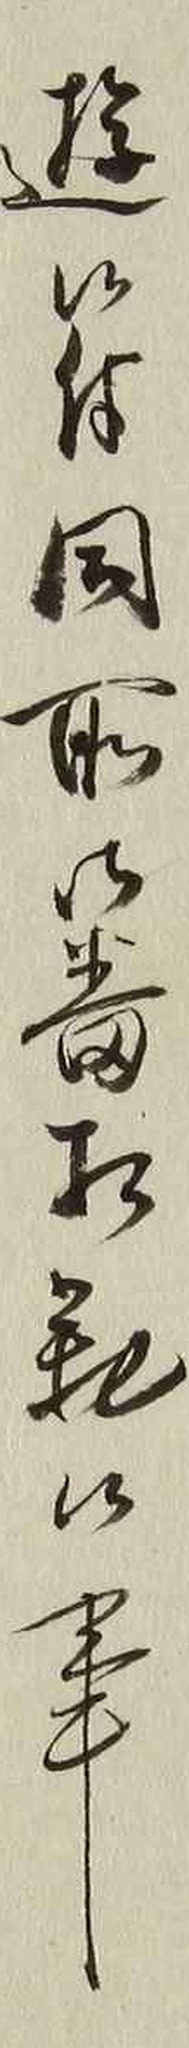遊候付同所御番相勤候事
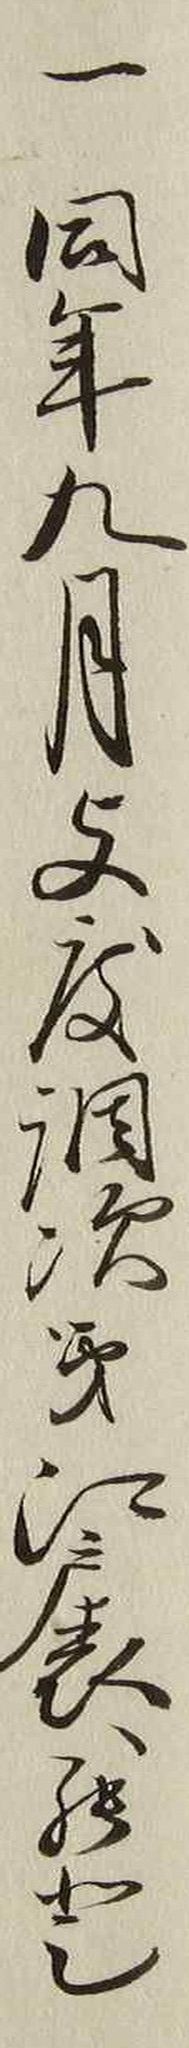一同年九月支度調次第江戸表ㇸ罷登
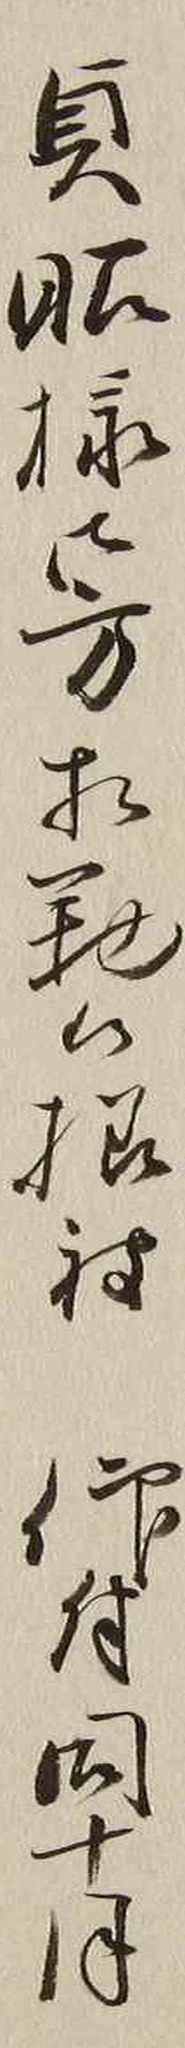貞昭様御方相勤候様被仰付同十月
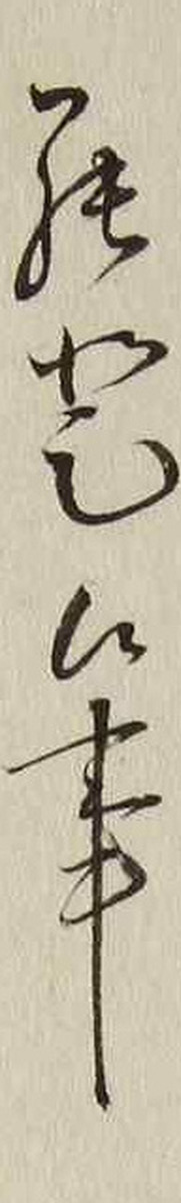罷登候事
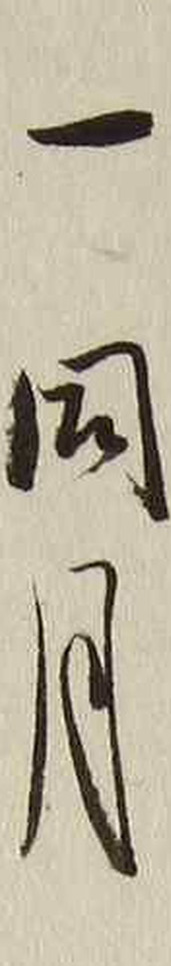一同月
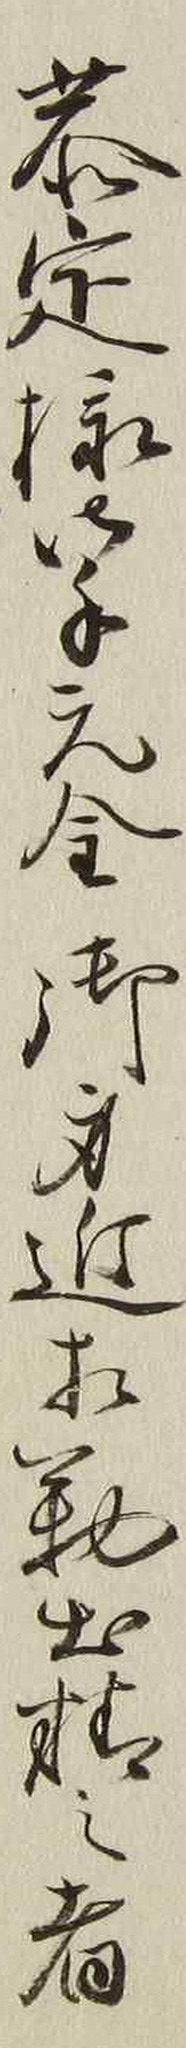恭定様御手元金御身近相勤出精之者
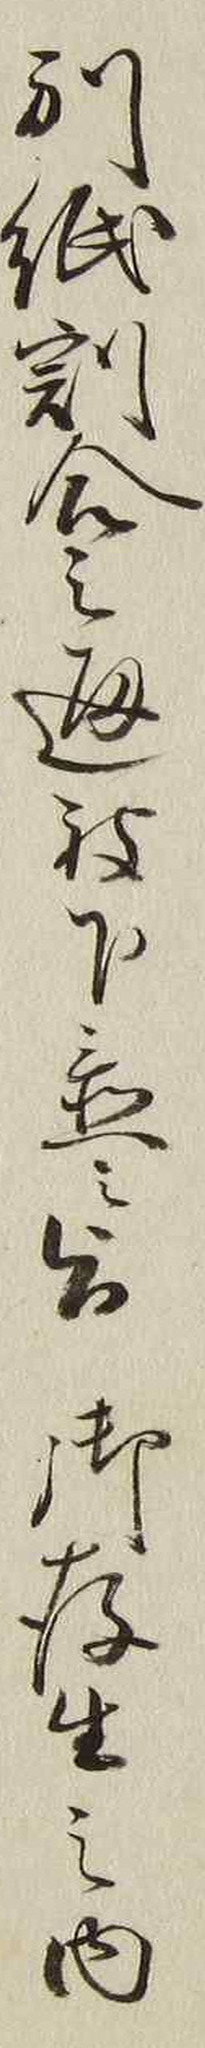別紙割合之通被下置之旨御存生之内
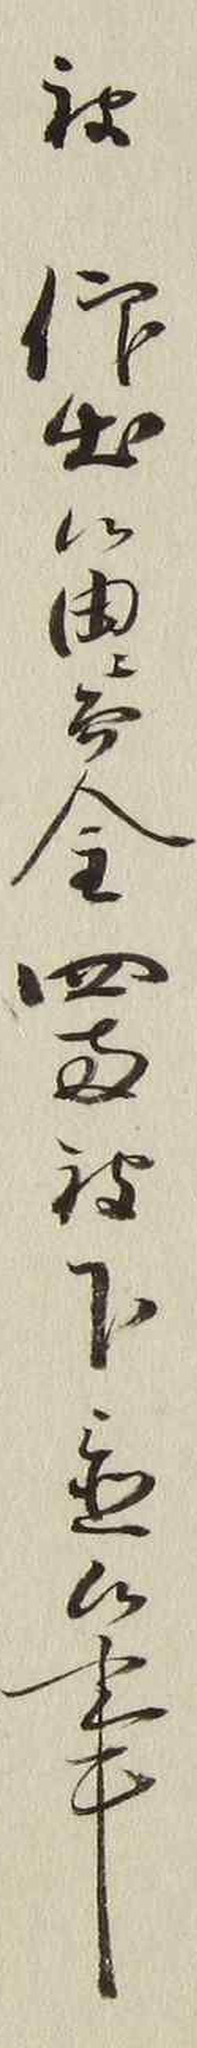被仰出候由ニ而金四両被下置候事
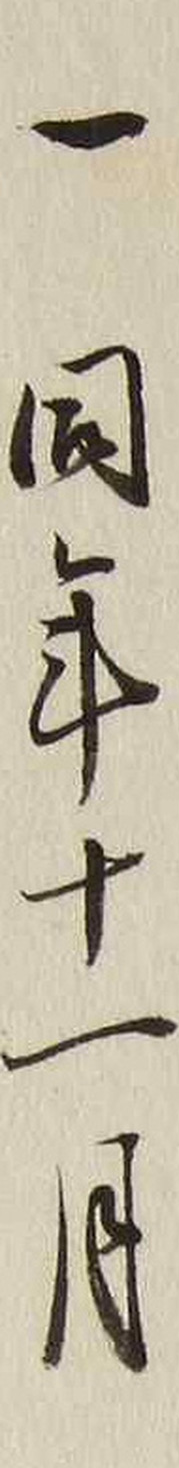一同年十一月
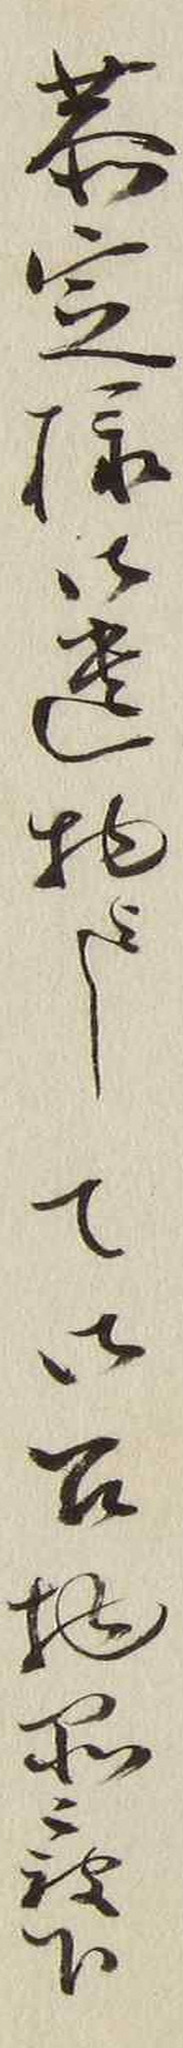恭定様御遺物として御召物品々被下
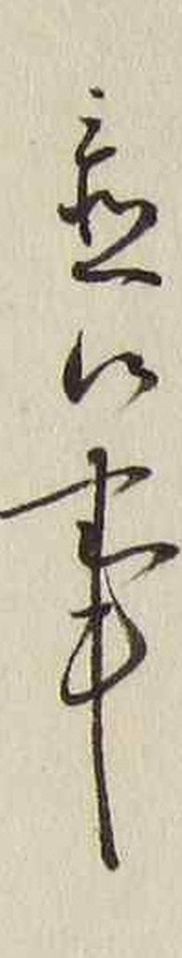置候事

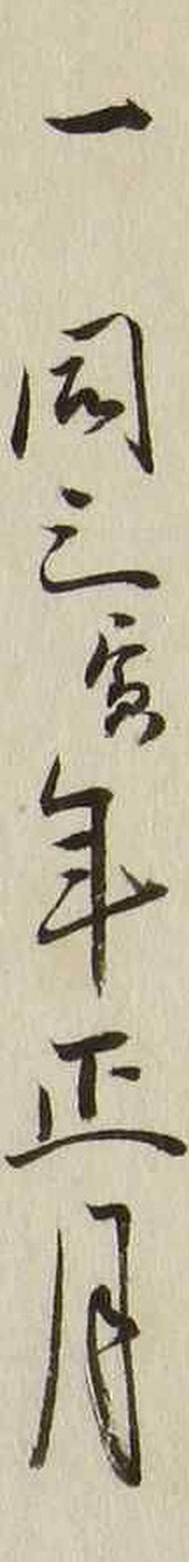一同三寅年正月
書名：諸士系譜　巻之163　な之部5
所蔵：会津若松市立会津図書館
